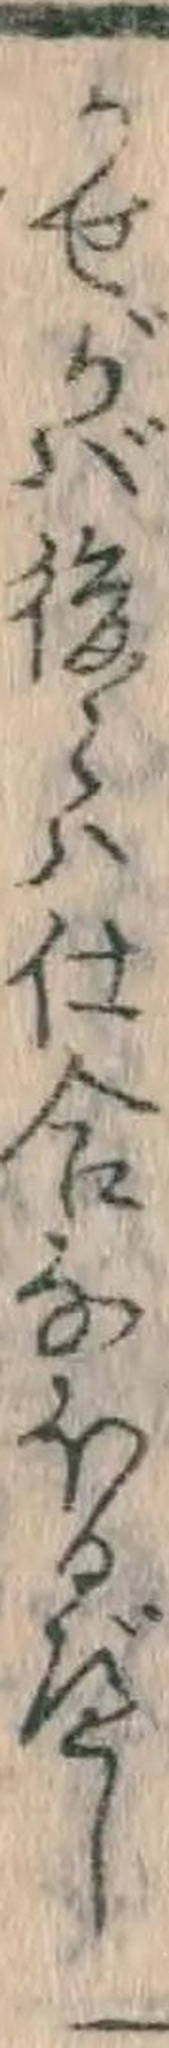かせがば後々は仕合なほるべし
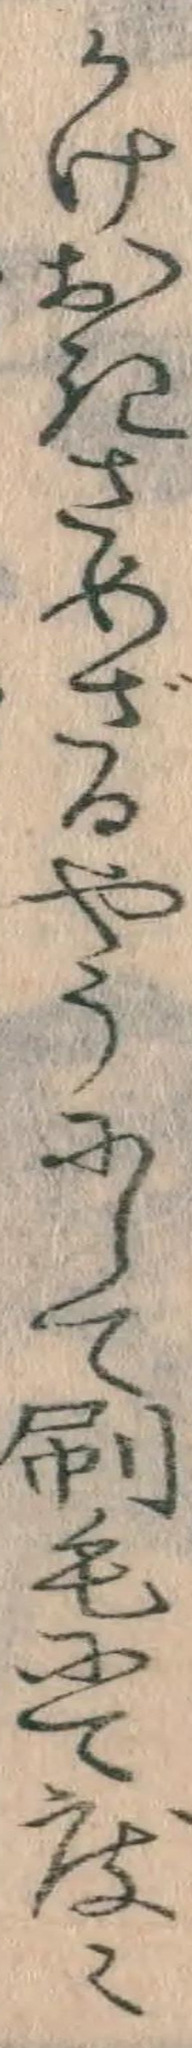かけおきさめざるやうにして刷毛にて度々
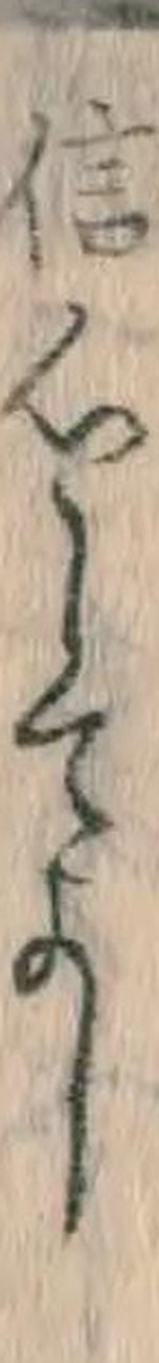信心してよし
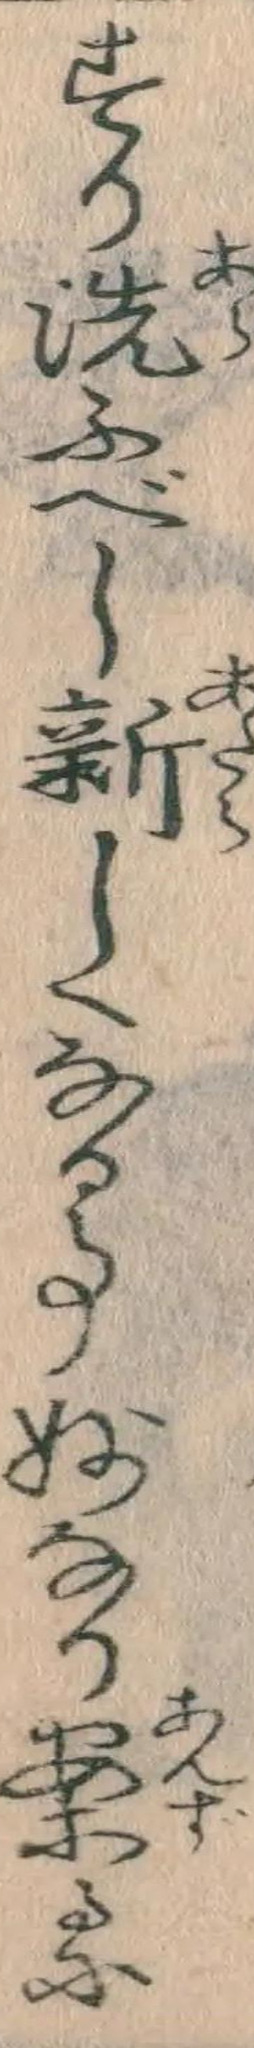すり洗ふべし新しくなる事妙なり案るに
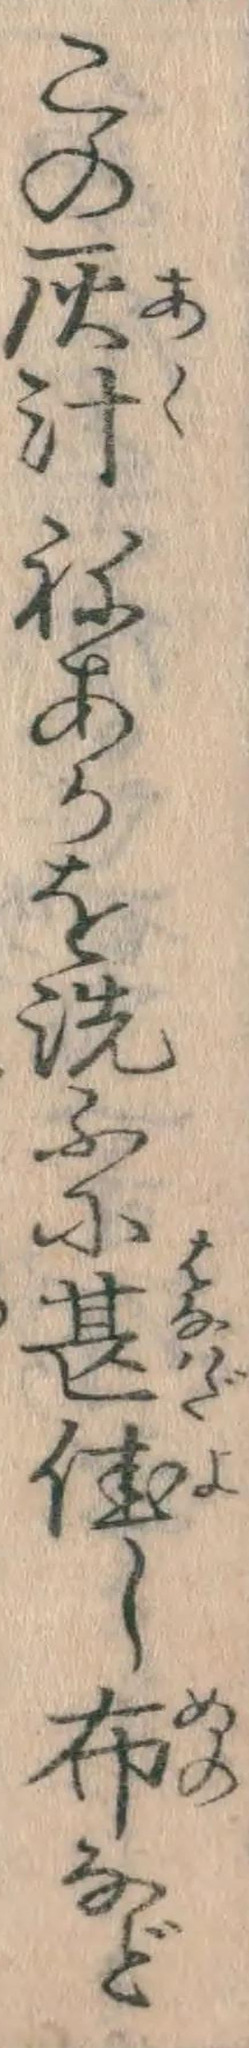この灰汁ねあかを洗ふに甚佳し布など
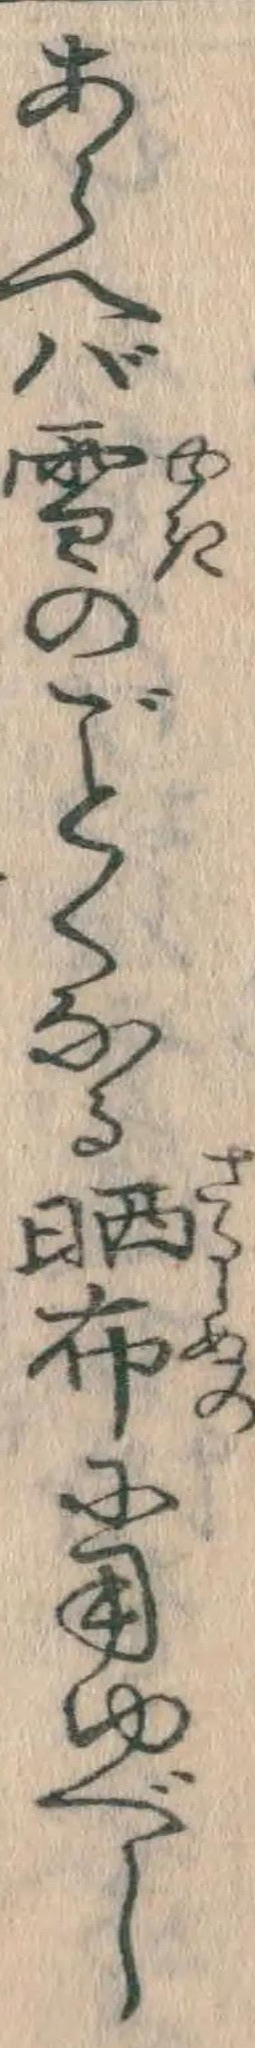あらへば雪のごとくなる晒布に用ゆべし
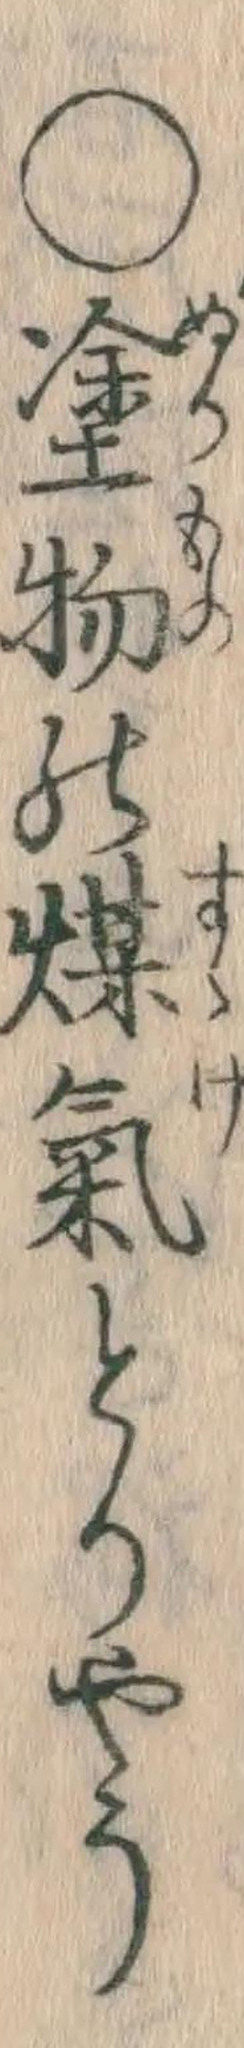○塗物の煤気とりやう
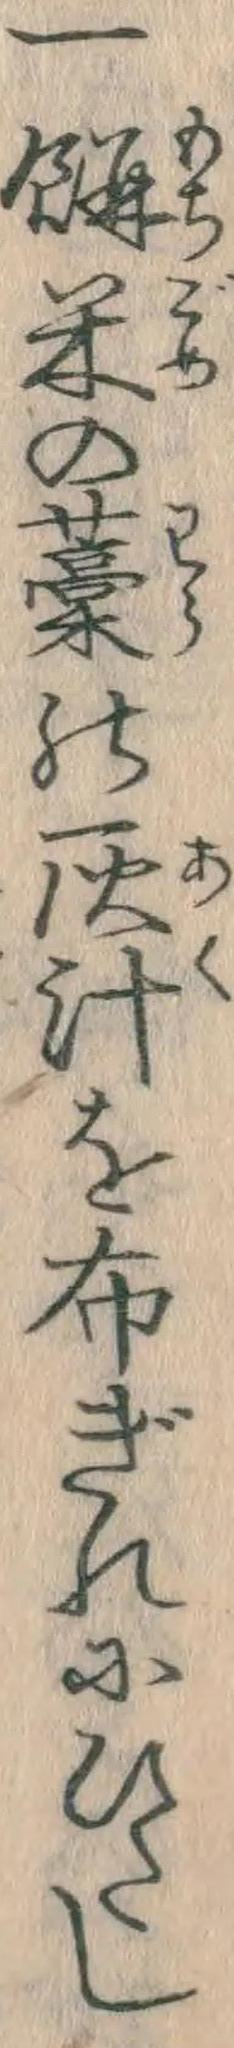一餅米の藁の灰汁を布ぎれにひたし
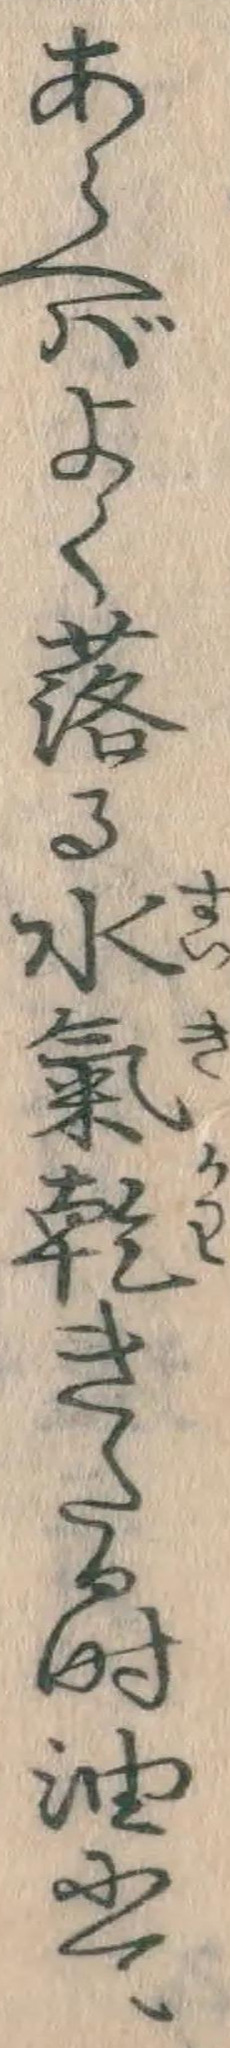あらへばよく落る水気乾きたる時油にて
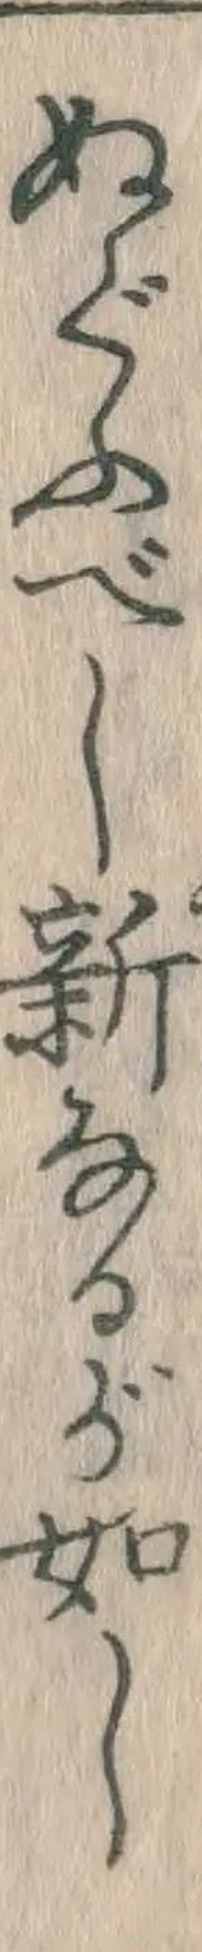ぬぐふべし新なるが如し
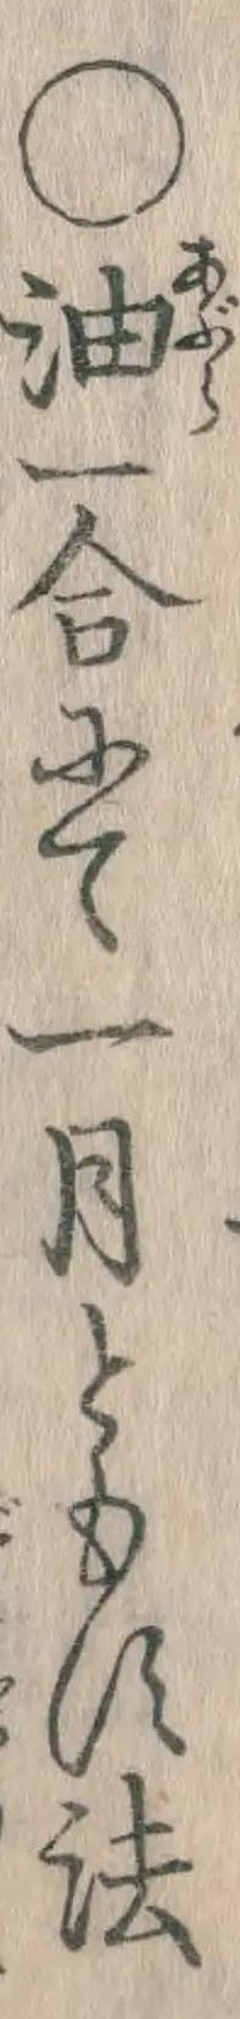○油一合にて一月ともす法
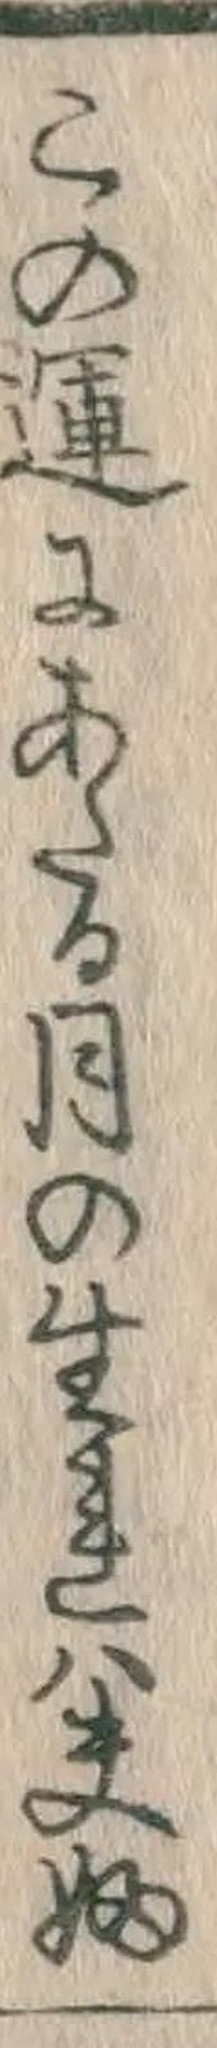この運にあたる月の生れは夫婦
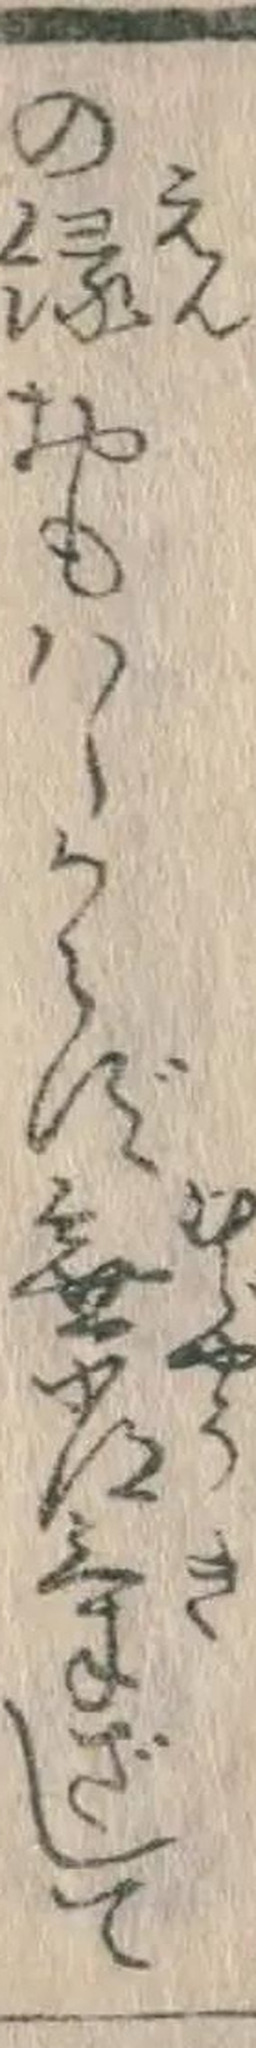の縁おもはしからず無常気ざして
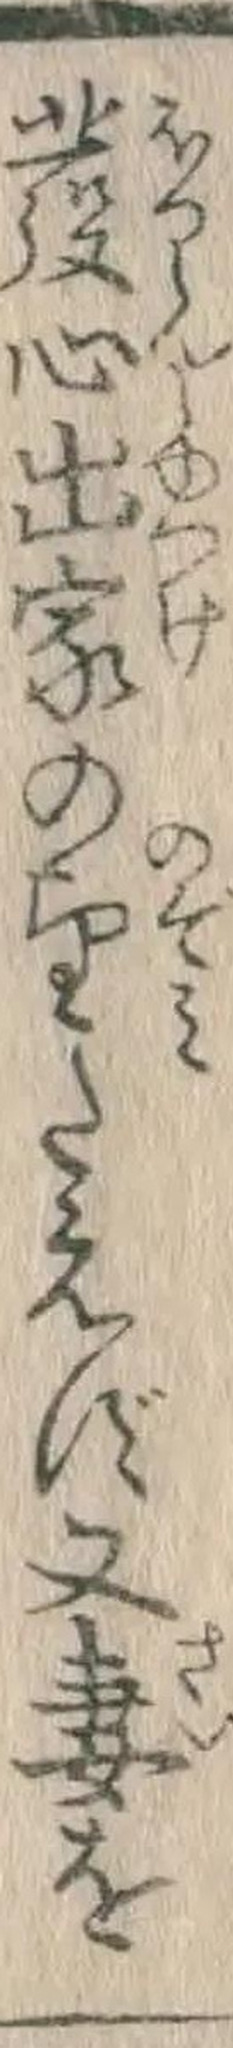発心出家の望たえず又妻を
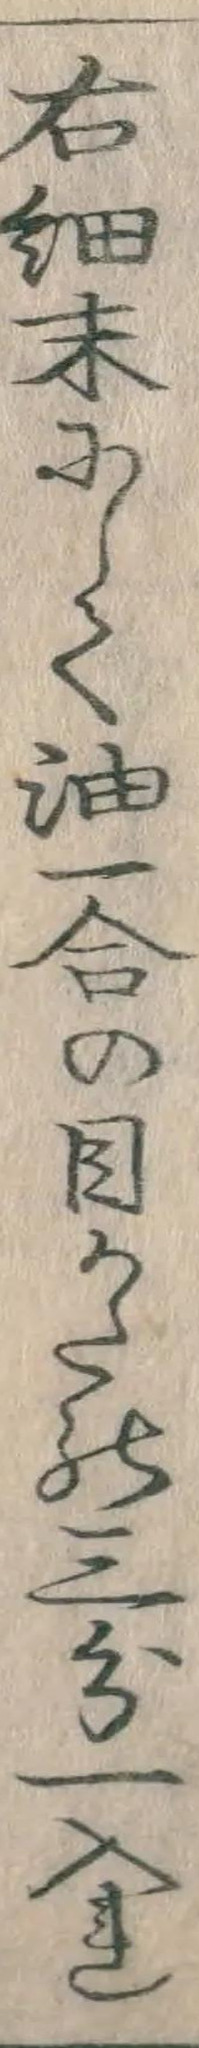右細末にして油一合の目かたの三分一入れ
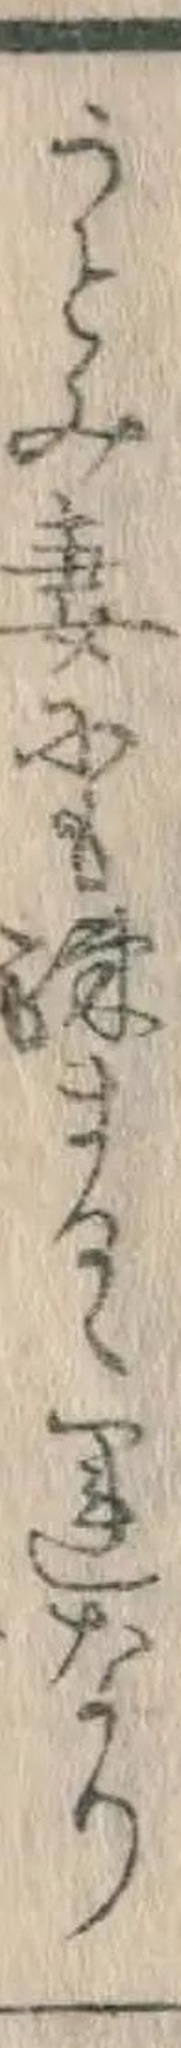うとみ妻にも疎まるゝ運なり
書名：広益秘事大全 3巻. [2]
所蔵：国立国会図書館 National Diet Library, JAPAN
